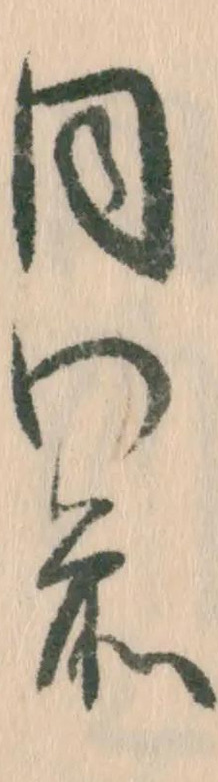同門前
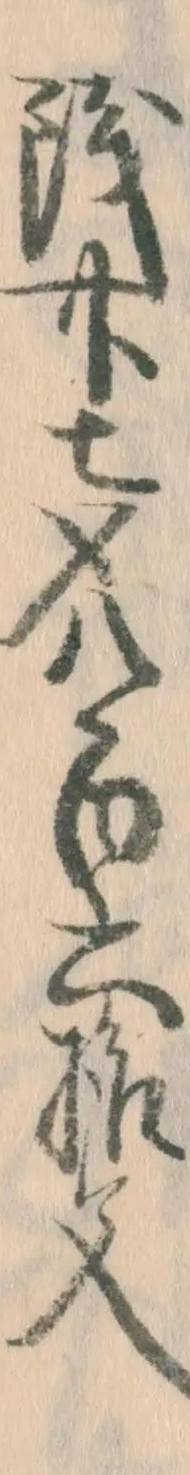銭廿七〆八百六拾文

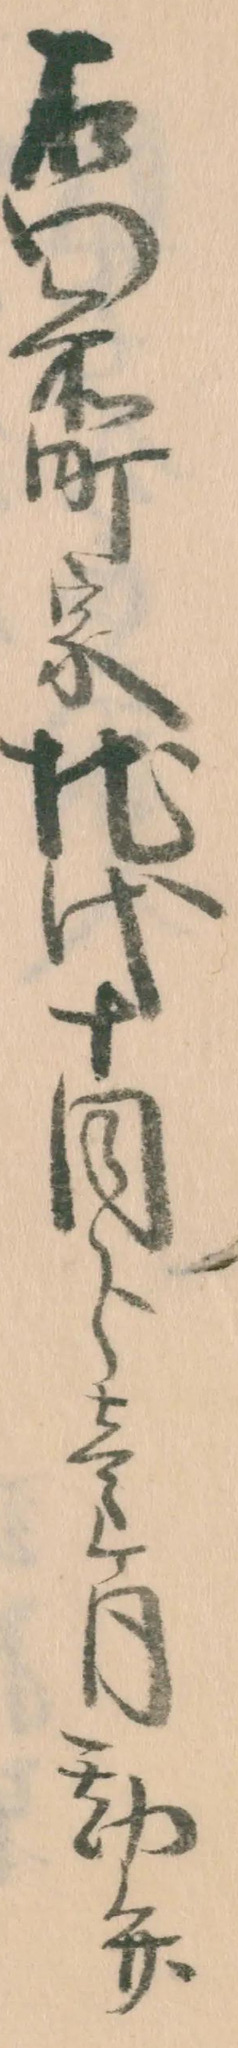右門前町家地代十月分壱ケ月勘弁
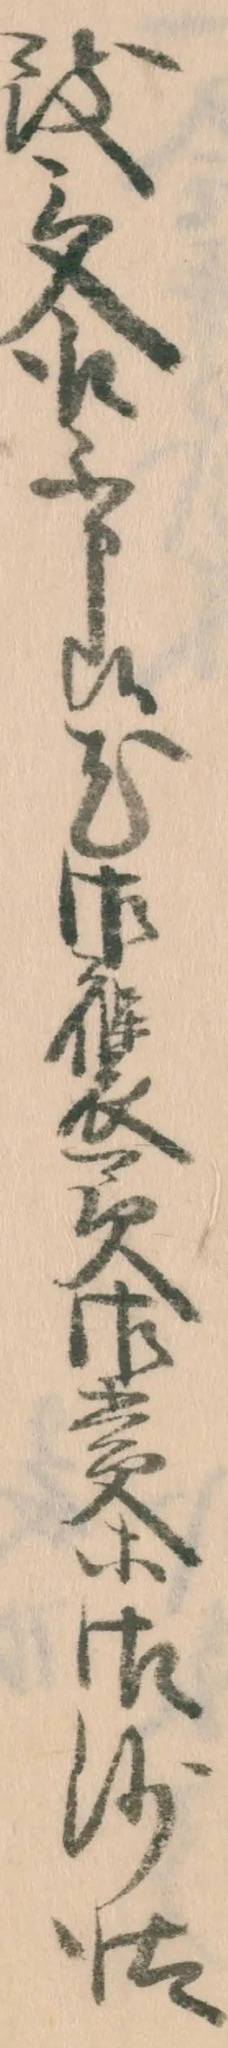致受取不申候尤御褒美御賞等御沙汰
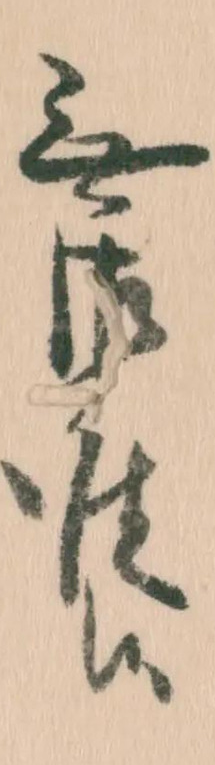無御座候
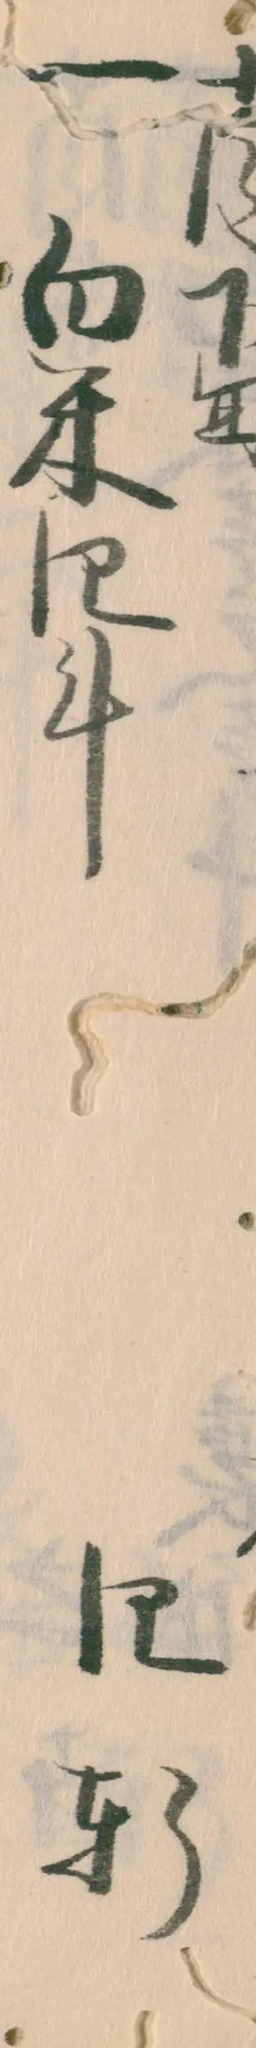一白米四斗四軒
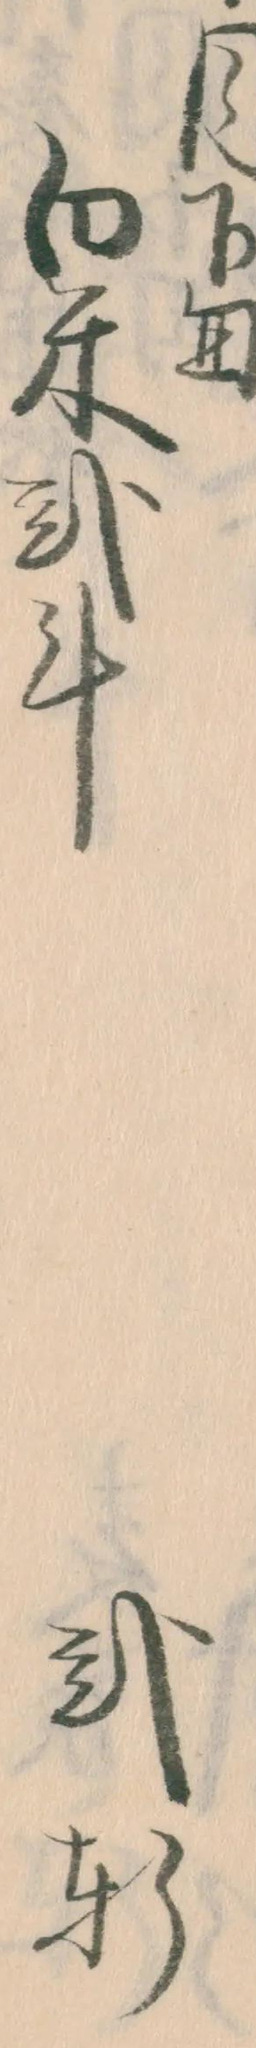一白米弐斗弐軒

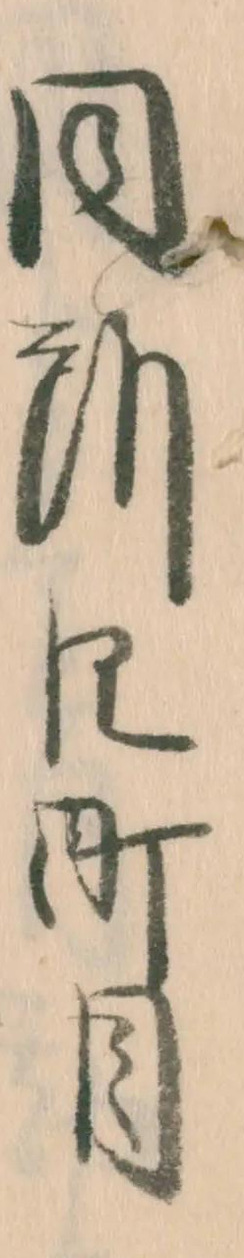同所五町目
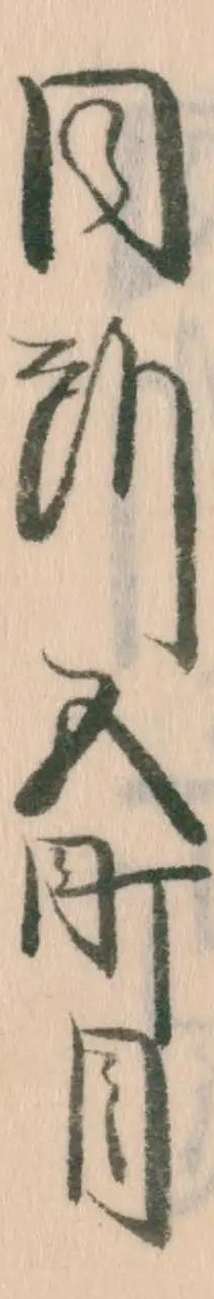同所五町目
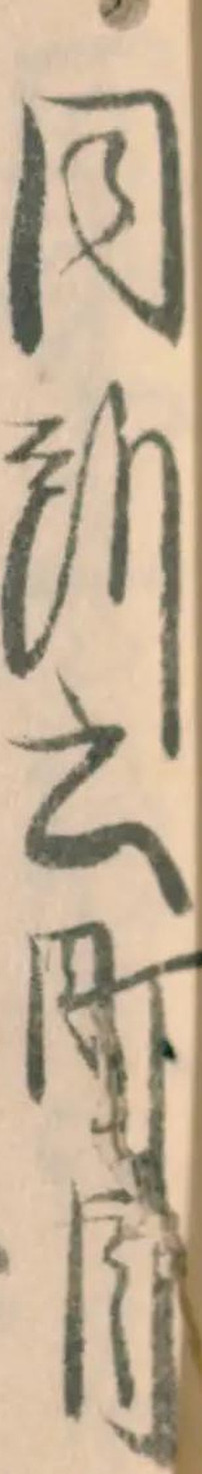同所六町目
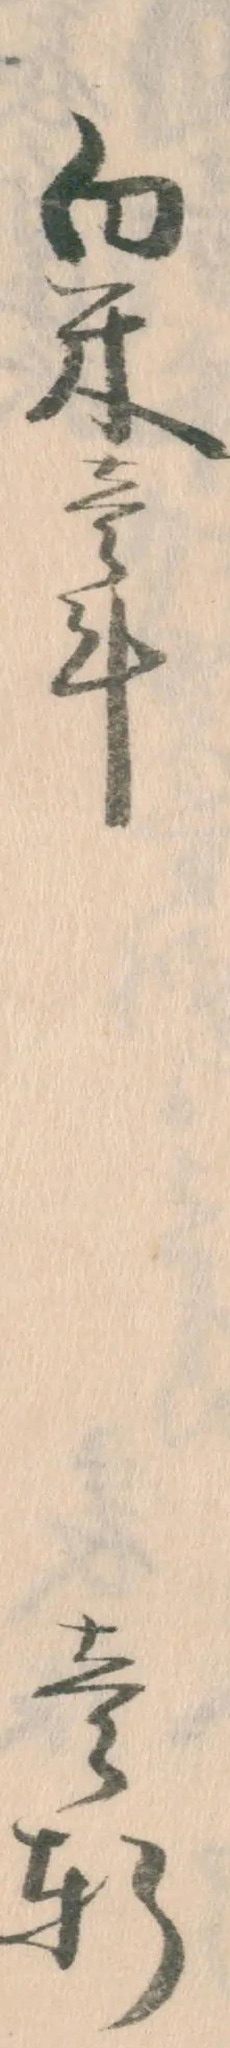一白米壱斗壱軒

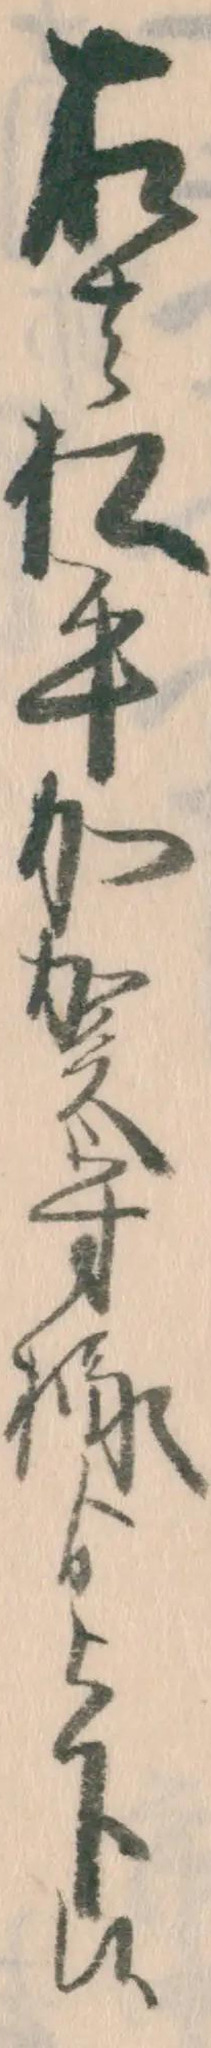右は松平加賀守様ゟ被下候

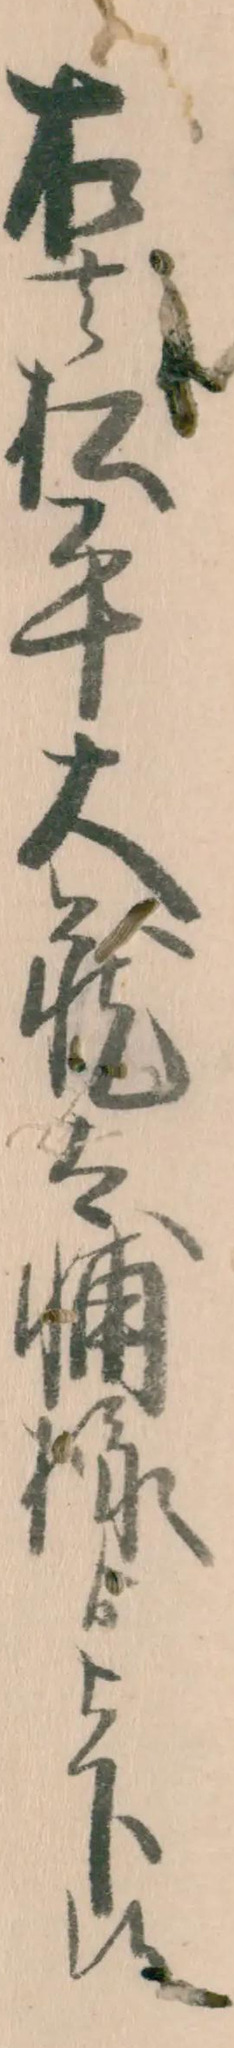右は松平大蔵太輔様ゟ被下候
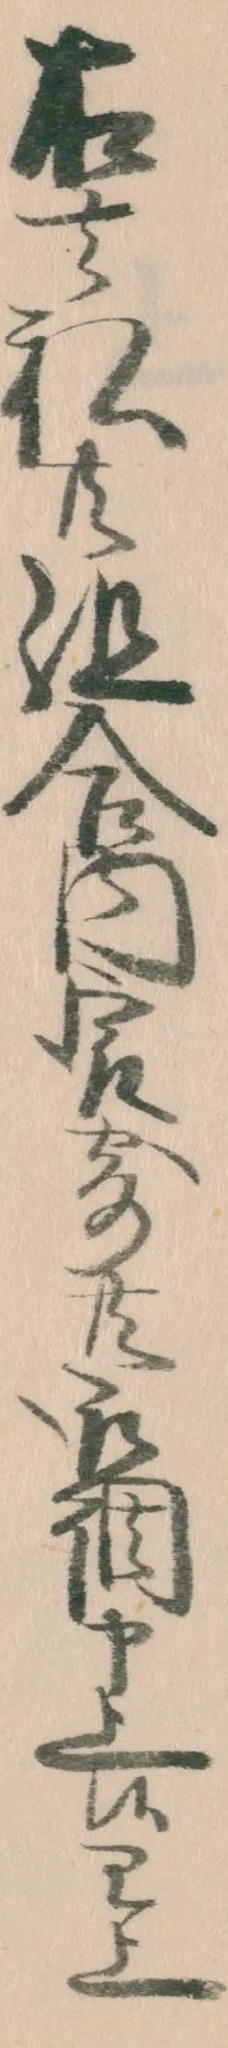右は私共組合内最寄共取調申上候已上
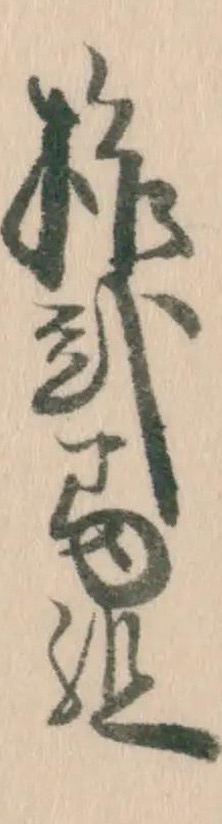拾弐番組
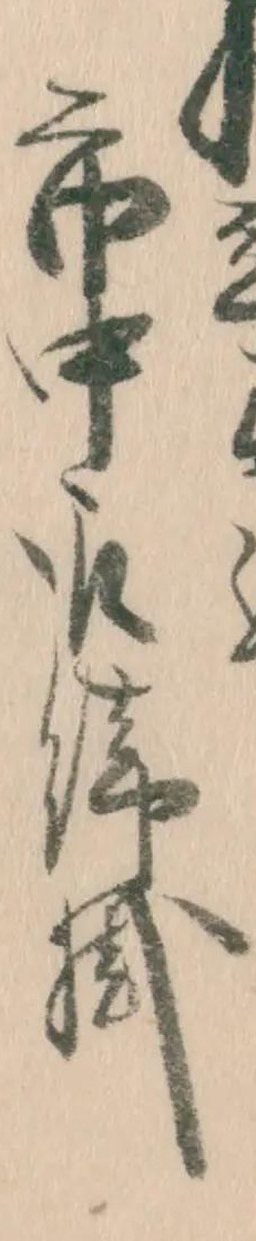市中取締掛
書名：武家方并寺院等ニテ施差出候一件
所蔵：国立国会図書館 National Diet Library, JAPAN
